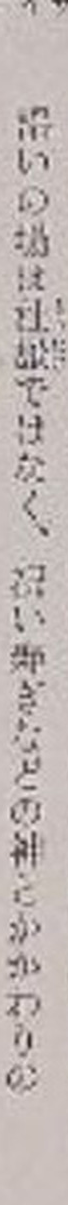謡いの場は杜嶽ではなく、祝い寿ぎなどの神とかかわりの
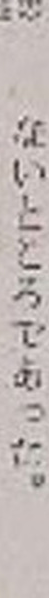ないところであった。
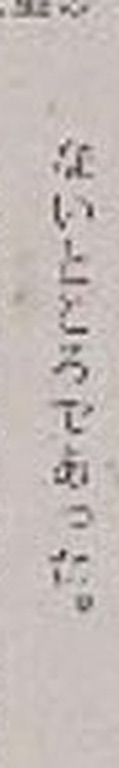ないところであった。
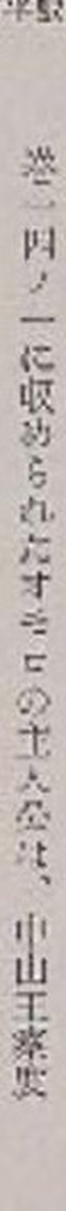巻一四ノ一に収められたオモロの主人公は、中山王察度
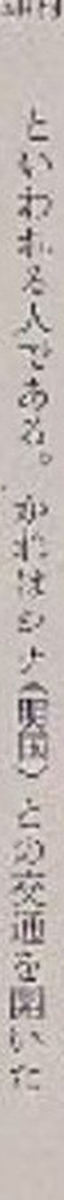といわれる人である。かれはシナ(明国)との交通を開いた
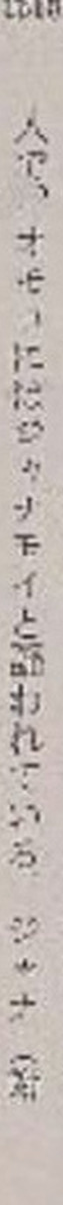人で、オモロにはジャナモイと謡われている。ジャナ(謝
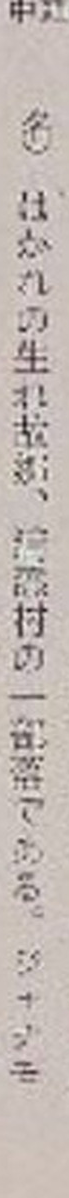名)はかれの生れ故郷、浦添村の一部落である。ジャナモ
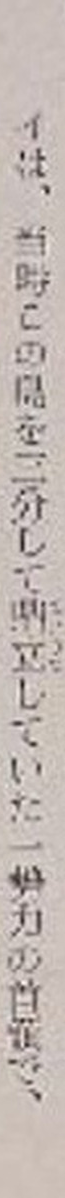イは、当時この島を三分して鼎立していた一勢力の首領で、
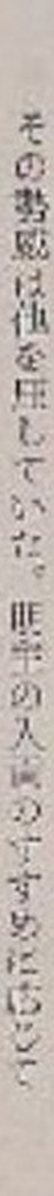その勢威は他を圧していた。明王の入貢のすすめに応じて
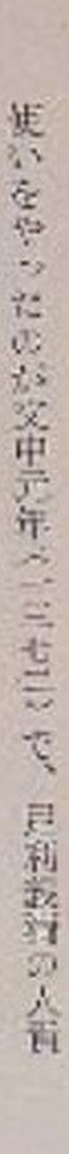使いをやったのが文中元年(一三七二)で、足利義満の入貢
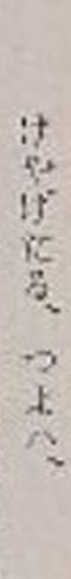けやげたる、つよハ、
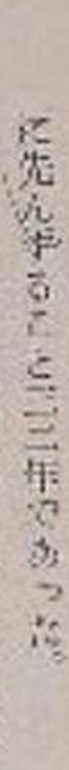に先んずること三二年であった。
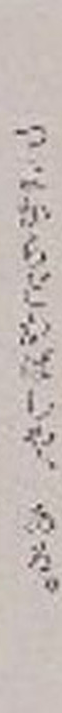つよからどかばしや、ある。
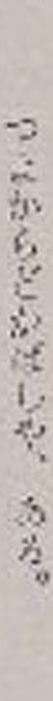つよからどかばしや、ある。
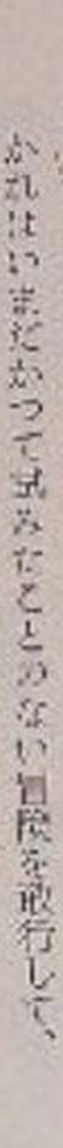かれはいまだかつて試みたことのない冒険を敢行して、
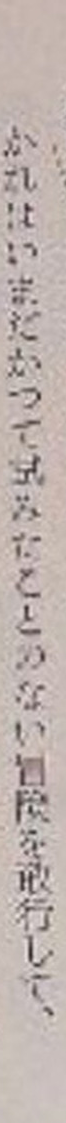かれはいまだかつて試みたことのない冒険を敢行して、
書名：沖縄口承文芸
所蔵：University of the Ryukyus Library
